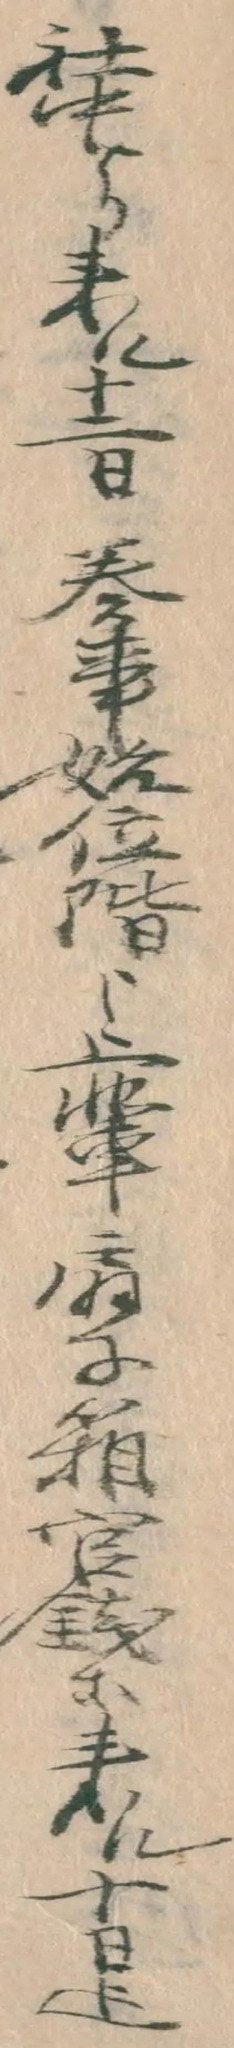社中より来ル十二日奏事始位階之上輩扇子箱官銭等来ル十日迄
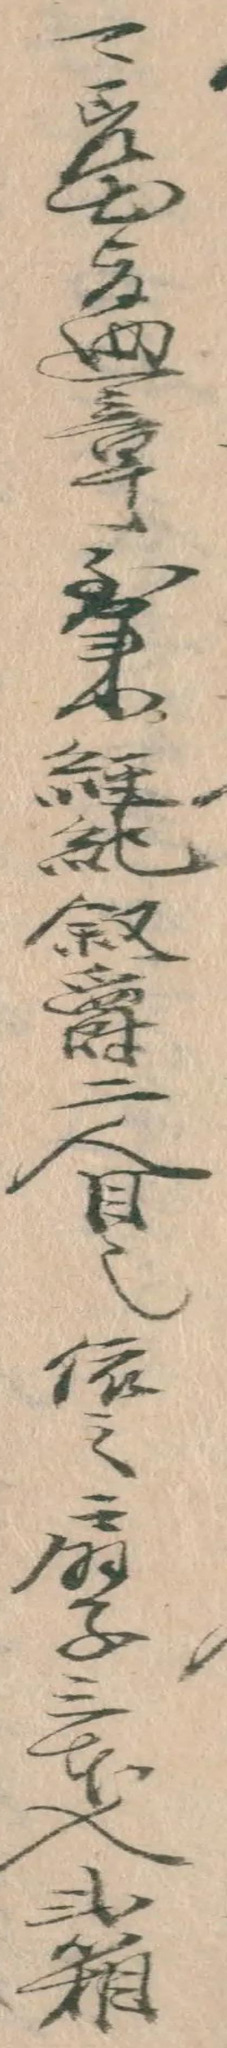可差出旨廻章到来経紀叙爵二人目也依之扇子三本入弐箱
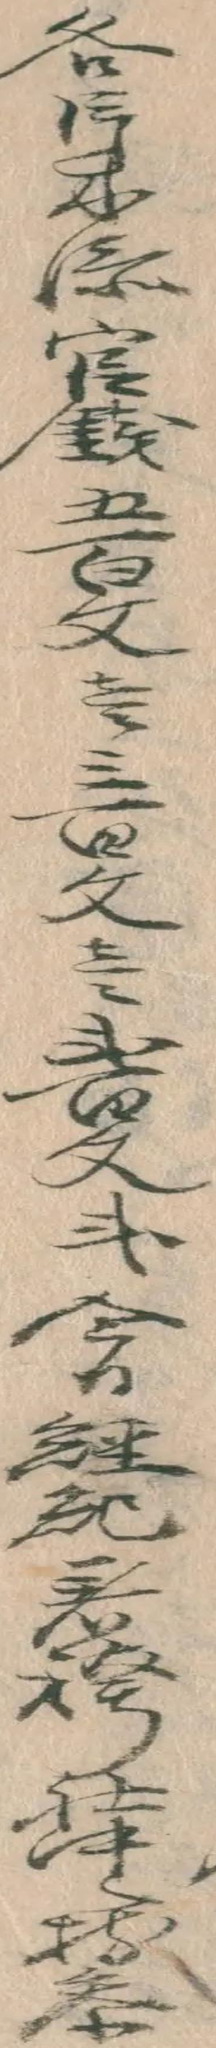各片木添官銭五百文壱三百文壱弐百文弐今日経紀着袴社中へ持参
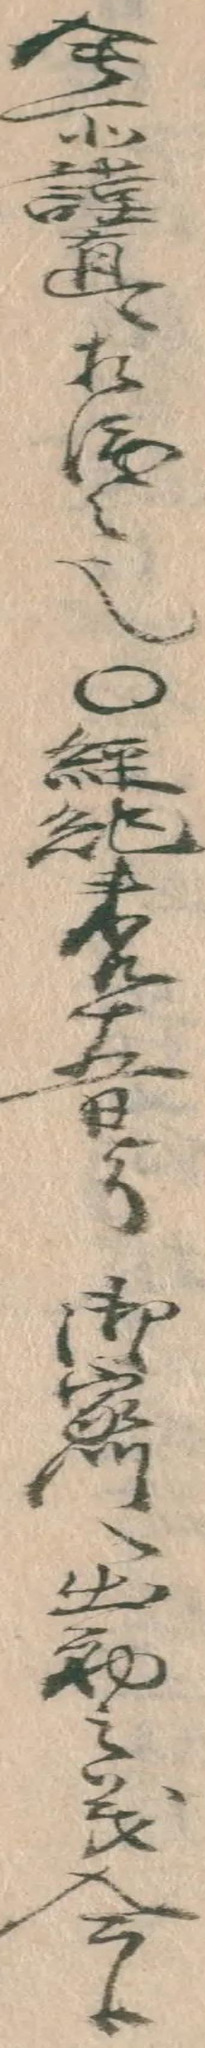會所謹直ニ相渡之也〇経紀来ル十五日より御家門へ出勤之義今日
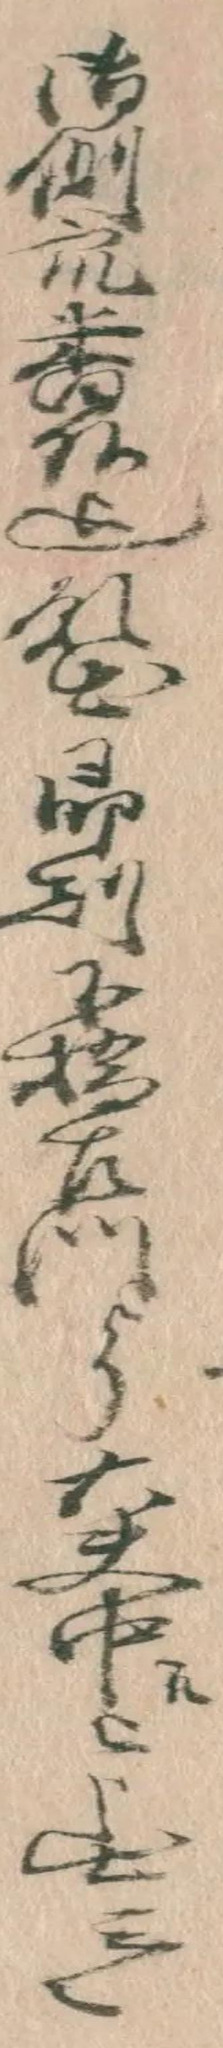御側衆番頭迄願出即刻下橋左門より大夫中并被申出立云々
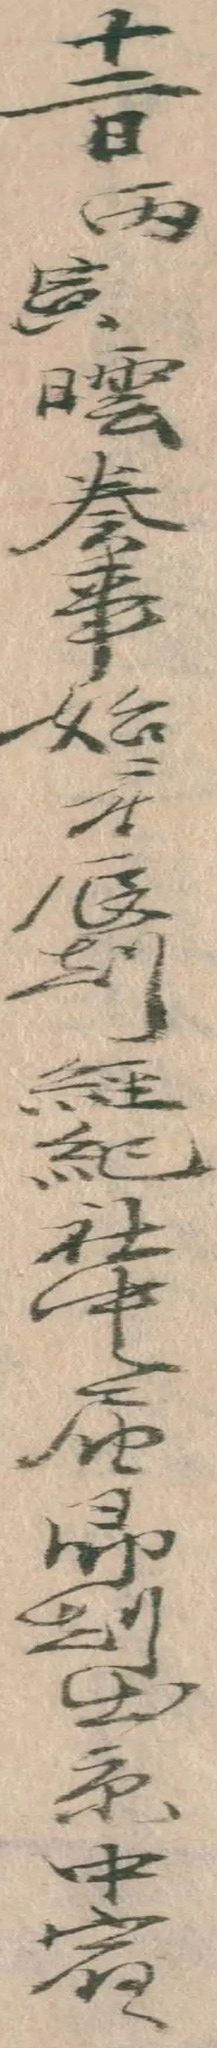十二日丙寅曇奏事始ニ付辰刻経紀社中へ届即刻出京中宿へ
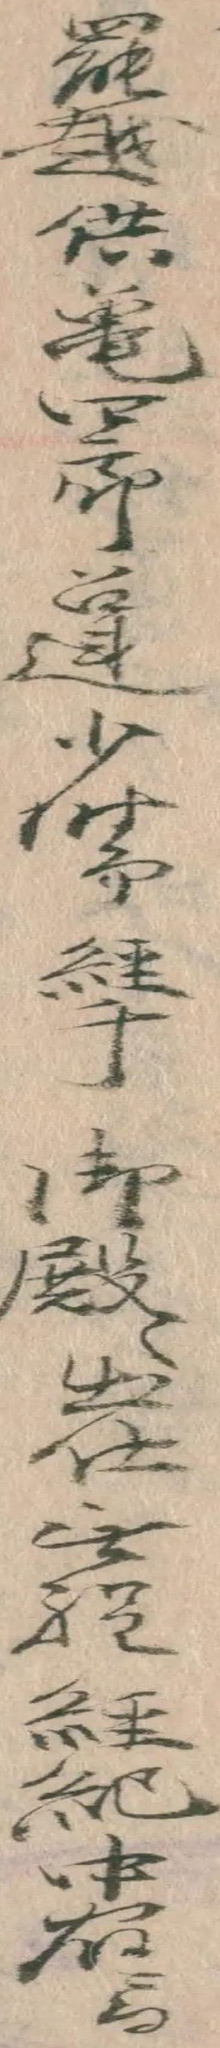罷越供亀四郎召連少時而経千御殿へ出仕無程経紀中宿ニ而
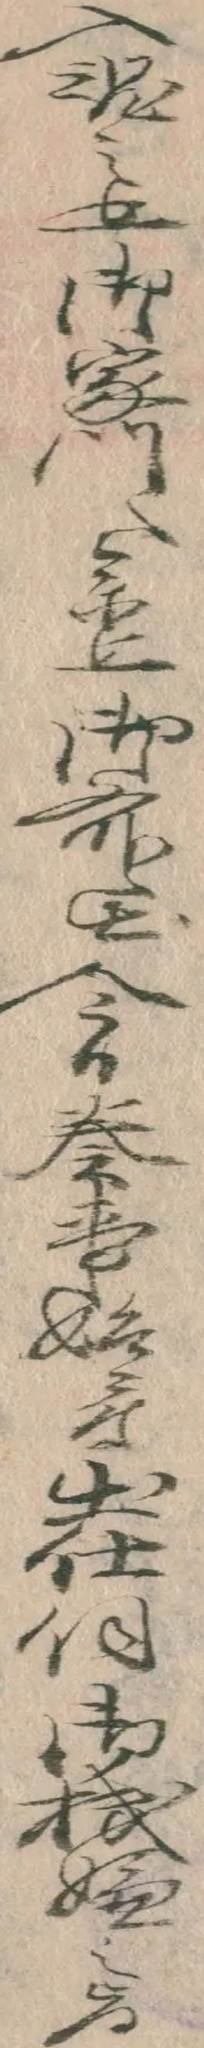入魂之上御家門へ被申上御前出今日奏事始ニ付出仕伺御機嫌之旨
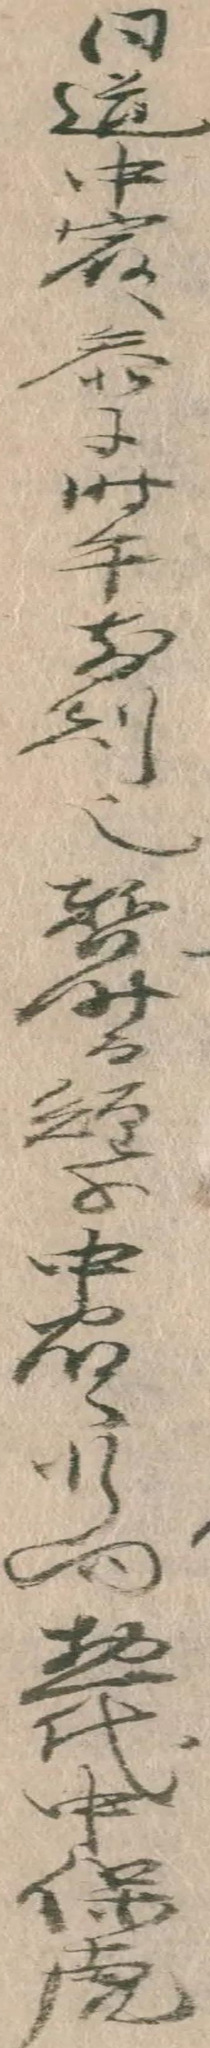同道中宿へ参に時午前刻也暫時而経千中宿え行向惣代中保虎
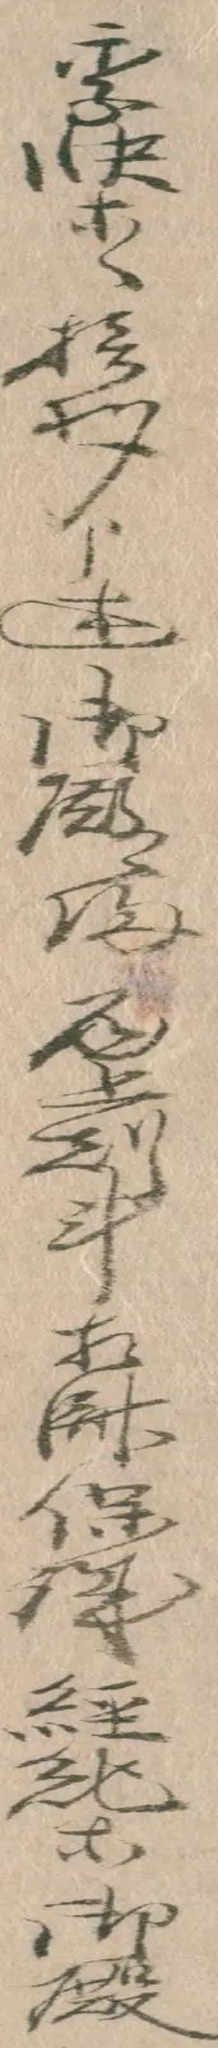季快等へ挨拶申述御殿へ帰酉上刻斗相済保織経紀等御殿
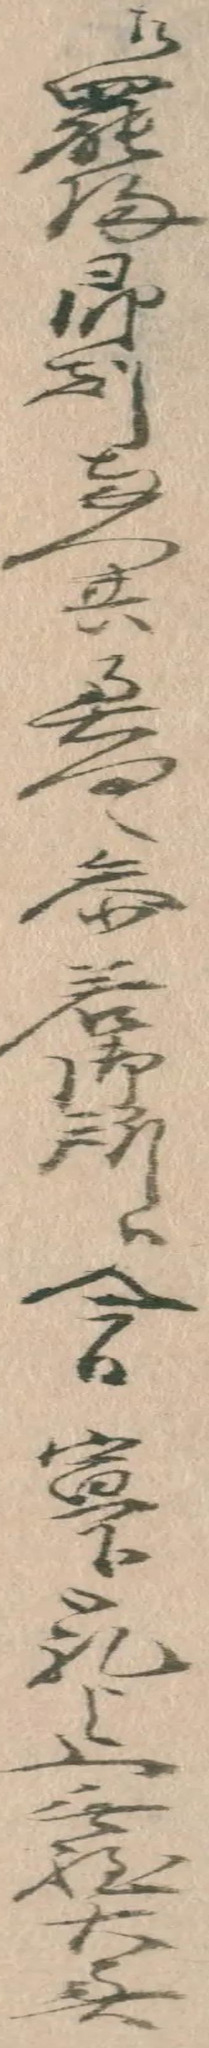え罷帰即刻両人共奥向へ参若御所え今日宣下御礼申上無程大奥
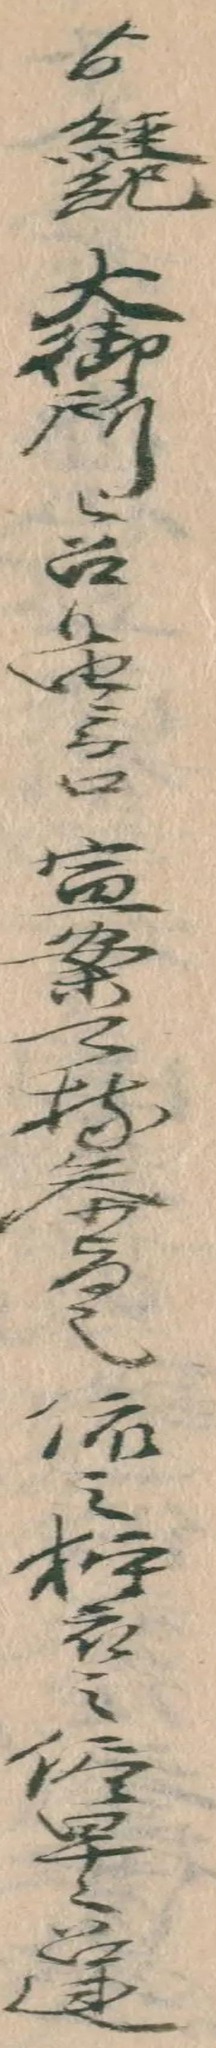ゟ経紀大御所被召候由ニ而口宣案可持参旨也依之狩衣之侭早々召連
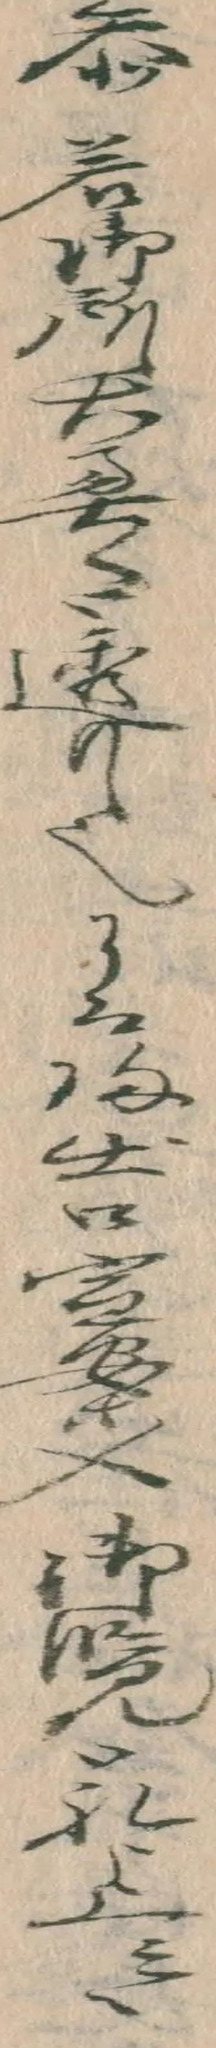参若御所大奥へ御逢引也了而帰出口宣案等入御覧御礼申上云々
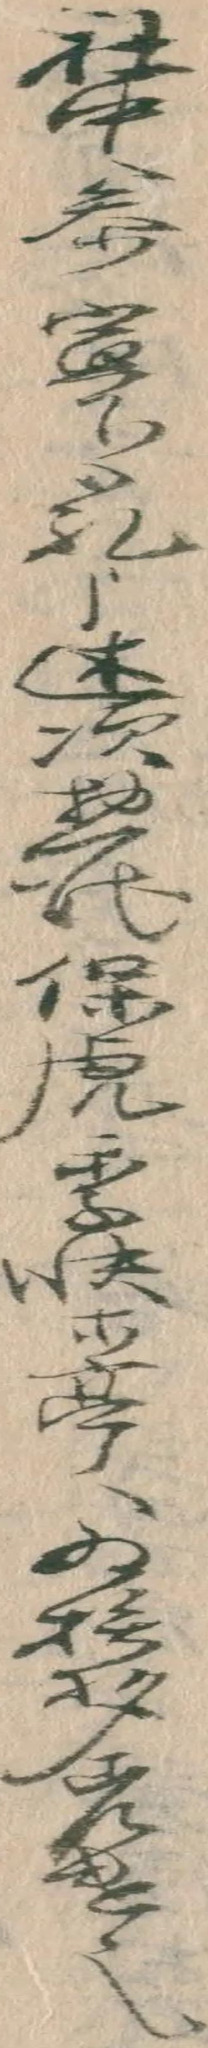社中へ参宣下御礼申述次惣代保虎季快等亭へ為挨拶差遣之
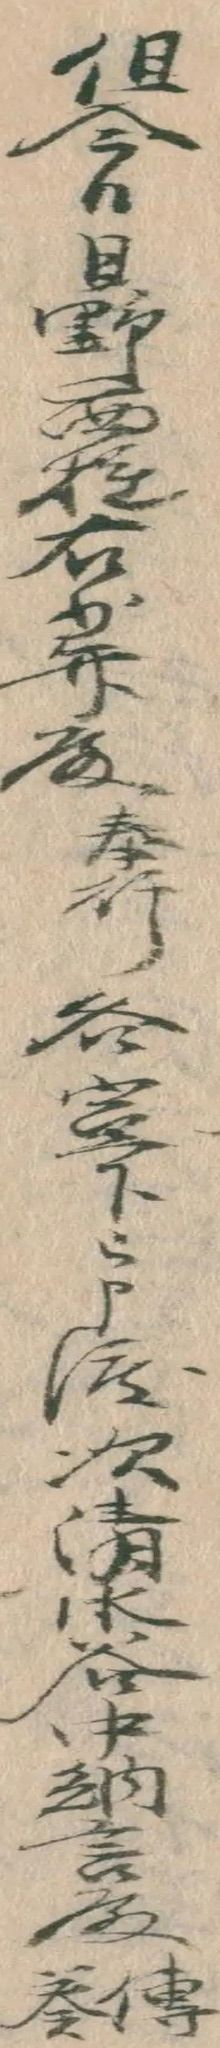但今日日野西権右少弁殿奉行各宣下被申渡次清水谷中納言殿転
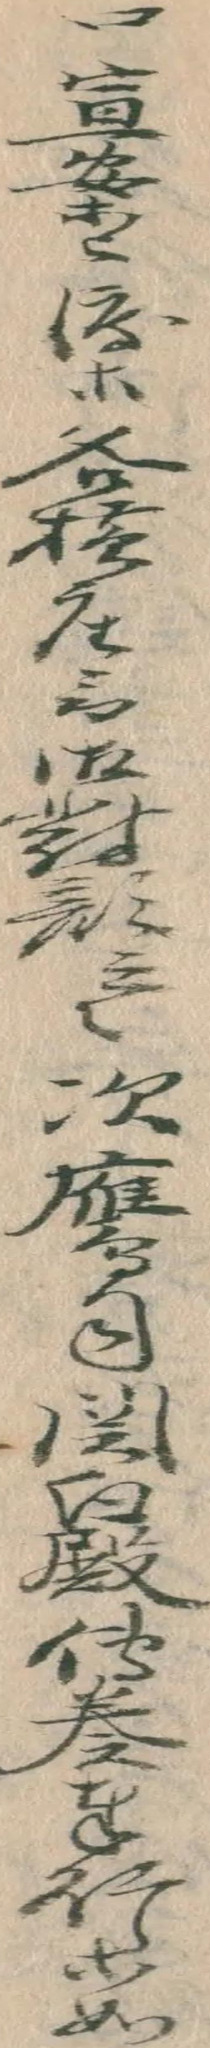御宣案被渡等各横居ニ而御対顔云〻次鷹司関四殿伝奏奉行等如
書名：賀茂社記録. 第66冊
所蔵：国立国会図書館 National Diet Library, JAPAN
